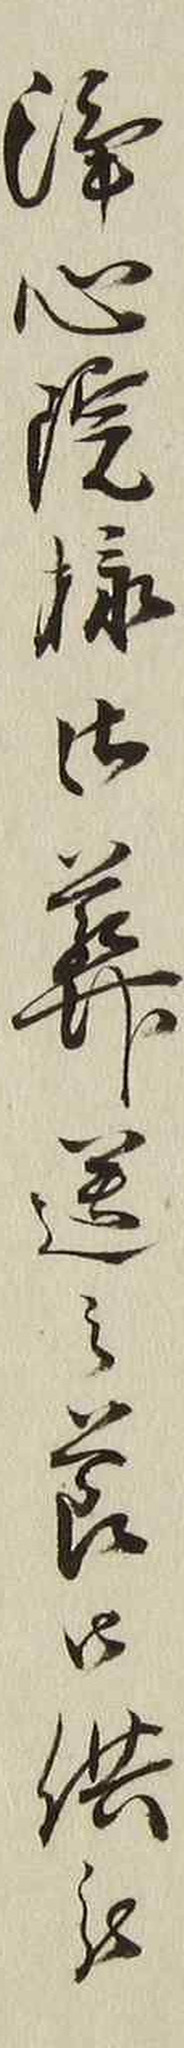浄心院様御葬送之節御供被
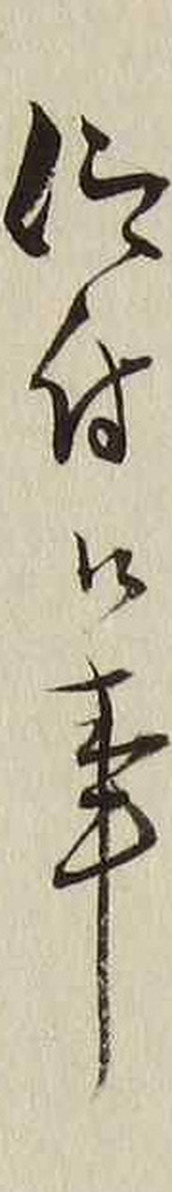仰付候事
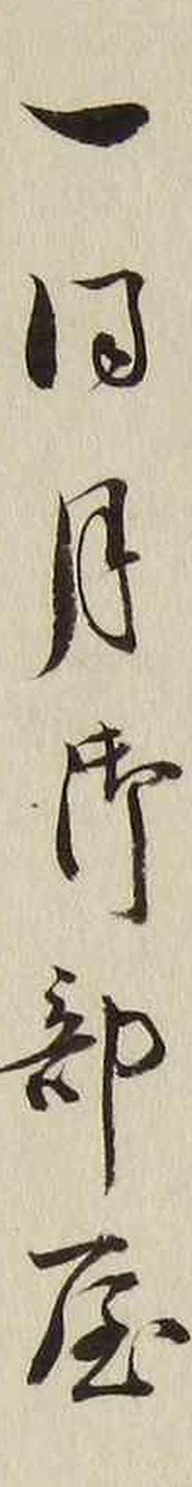一同月御部屋
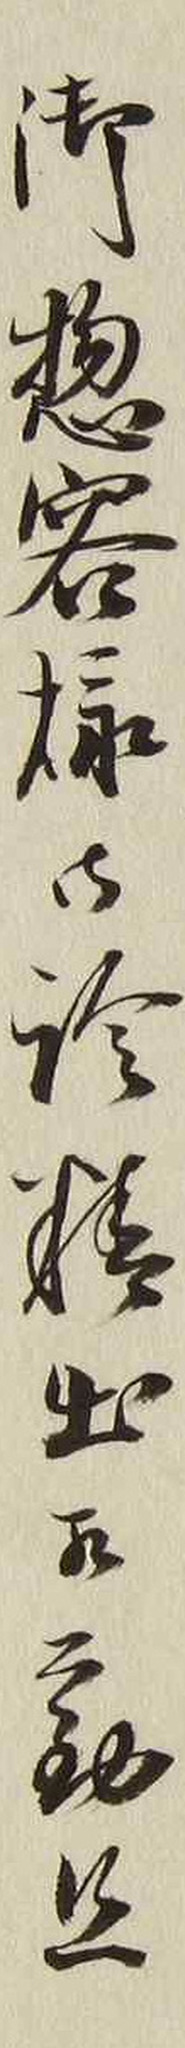御惣容様御診精出相勤且
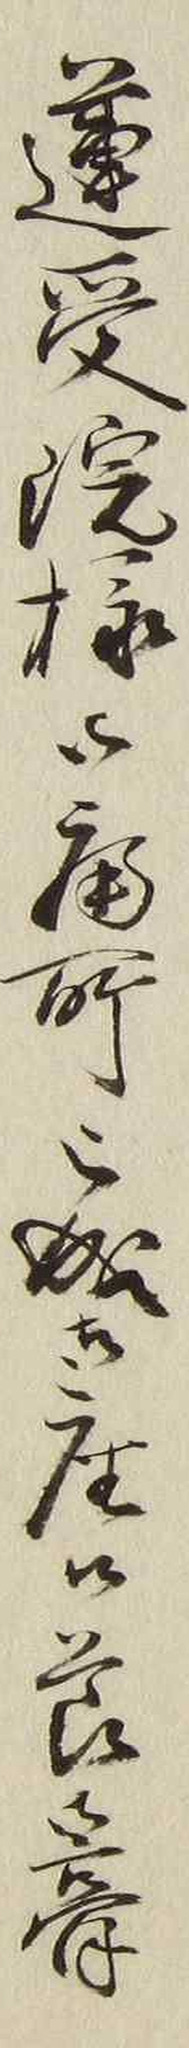蓮受院様御痛所被成御座候節御膏
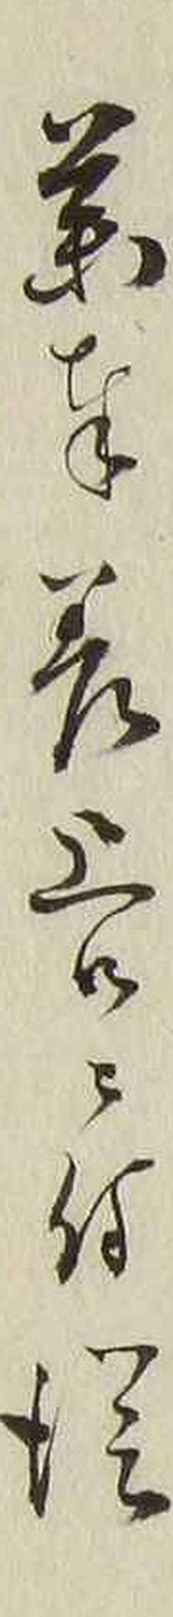薬奉差上候に付従

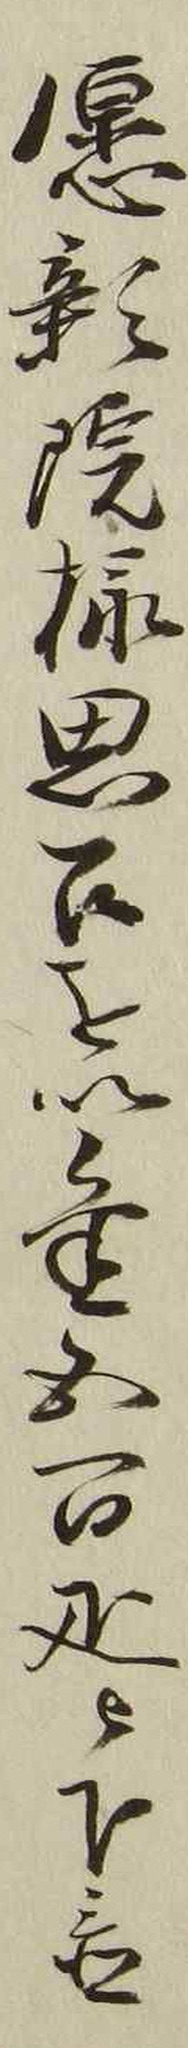愿彰院様思召を以金五百疋被下置
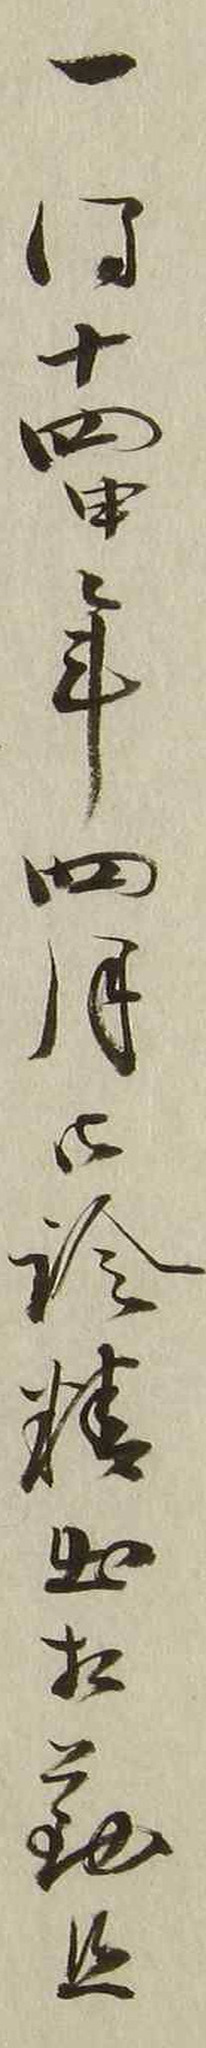一同十四申年四月御診精出相勤且
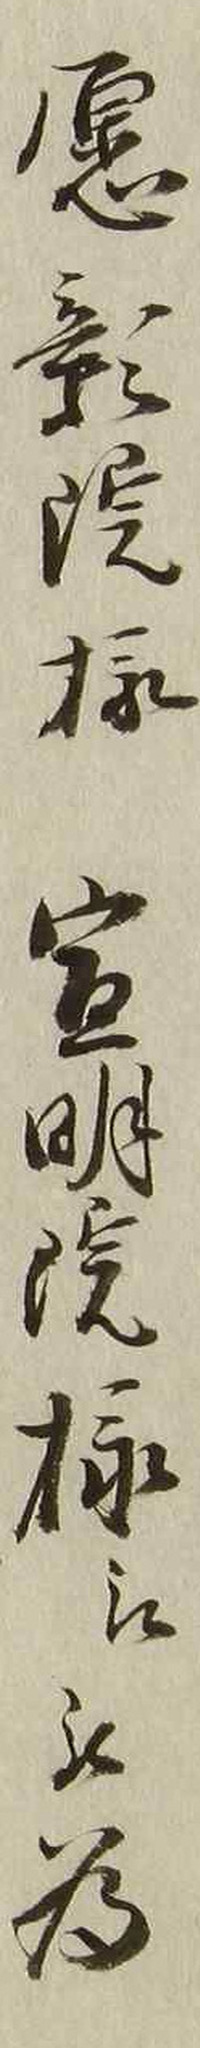愿彰院様宣明院様江被為
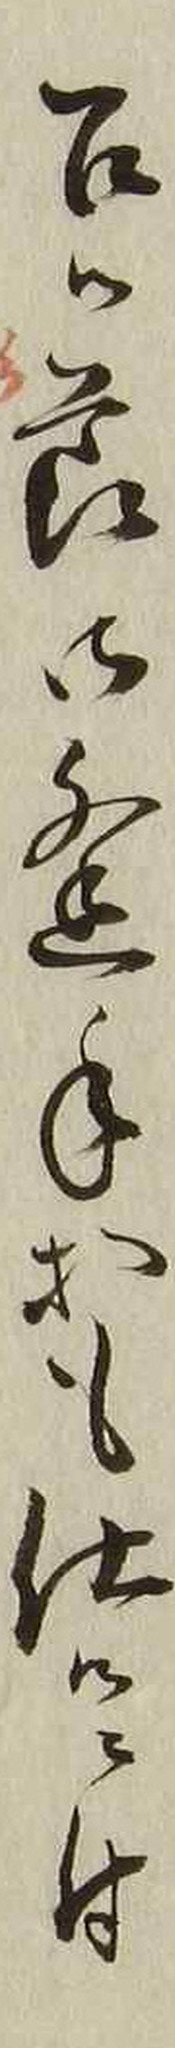召候節御逢手等も仕候に付
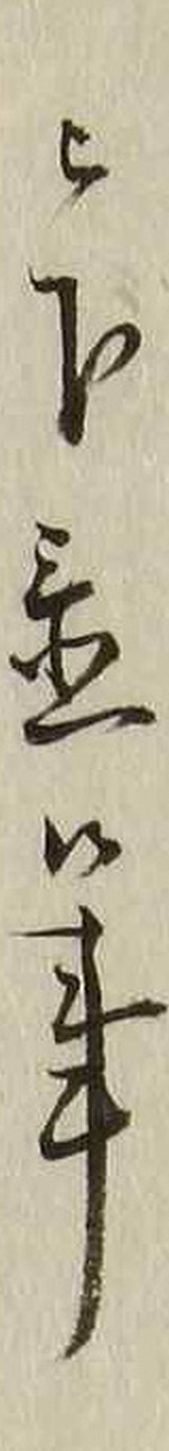被下置候事
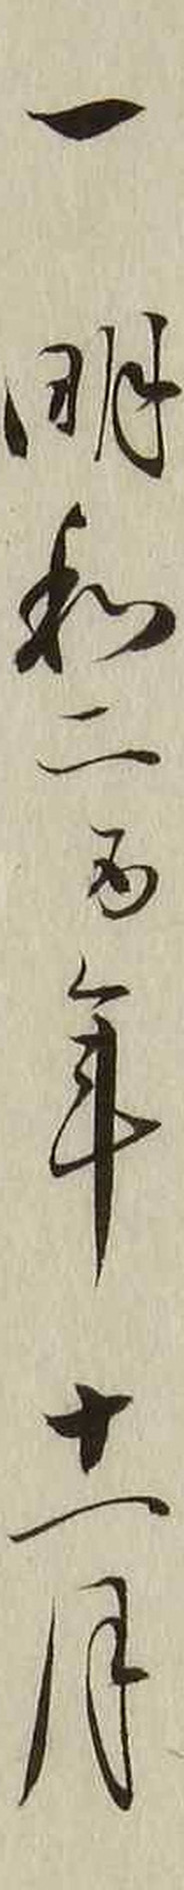一明和二酉年十一月
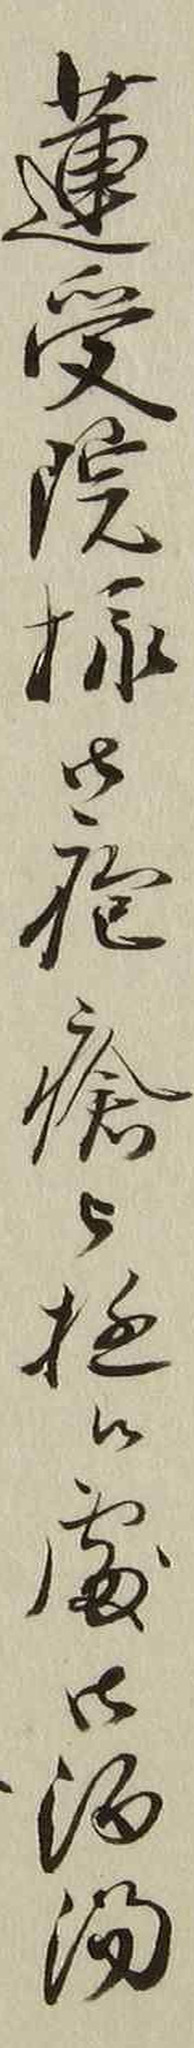蓮受院様御疱瘡被遊候処御酒湯
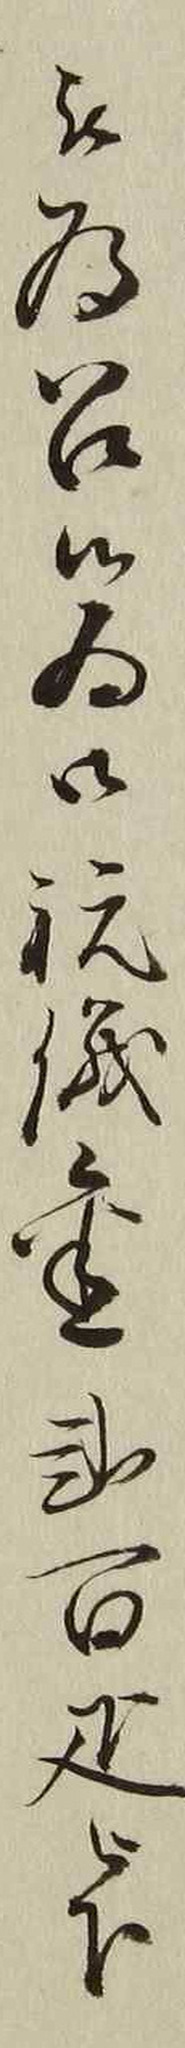被為召候為御祝儀金弐百疋被下
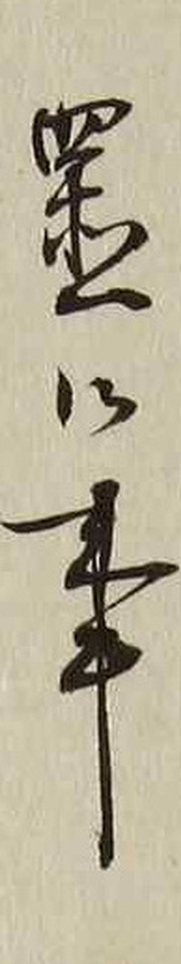置候事
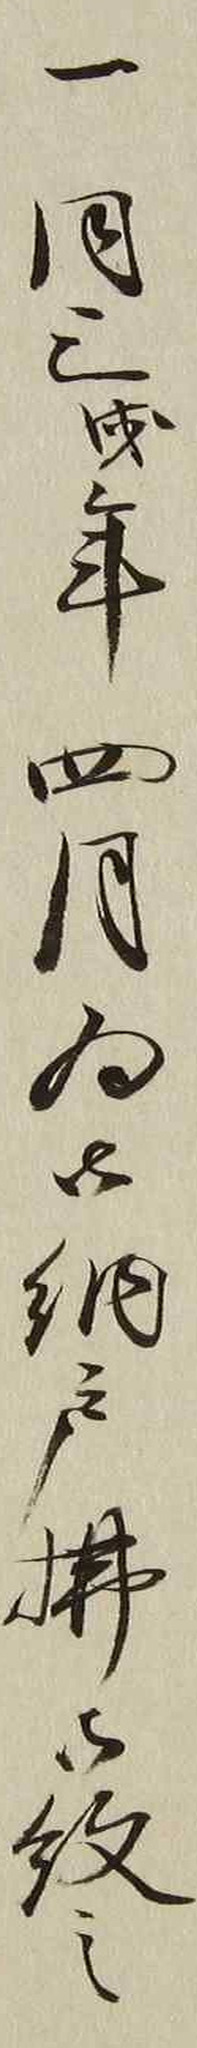一同三戌年四月為御納戸払御紋之
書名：諸士系譜　巻之157　ね之部1
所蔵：会津若松市立会津図書館
